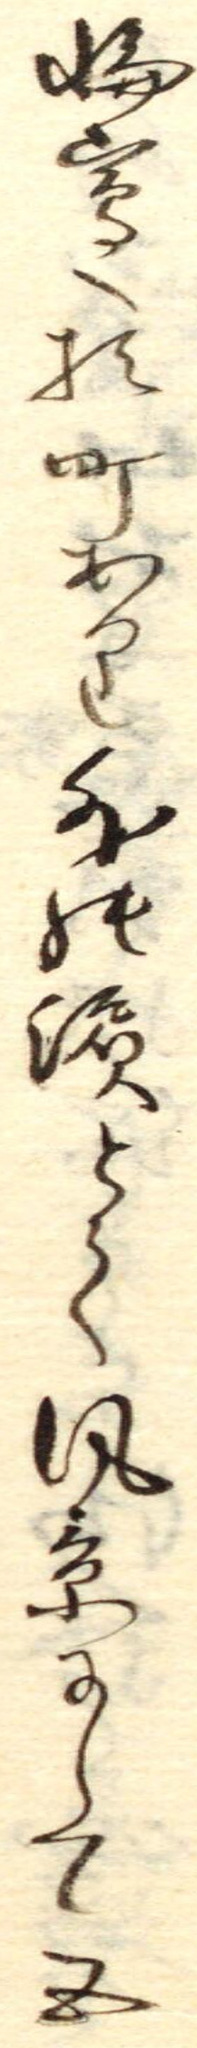輪嶌へ拾町あり外の浜とて風景にして五
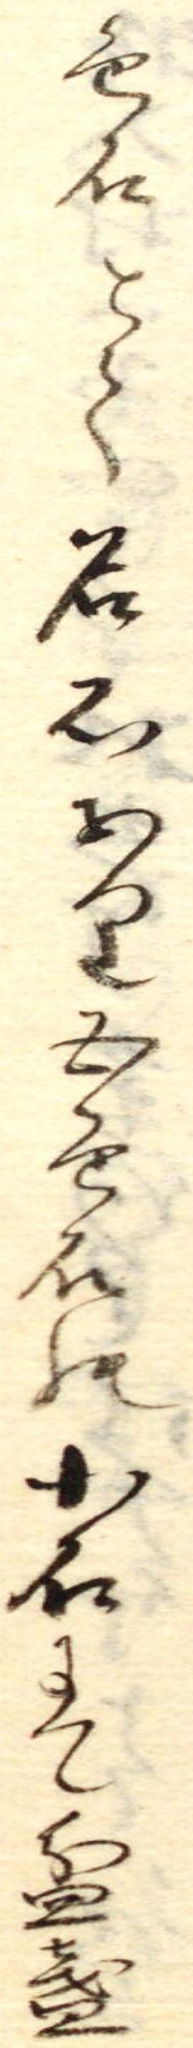色石とて名石あり五色石の小石にて盆盞
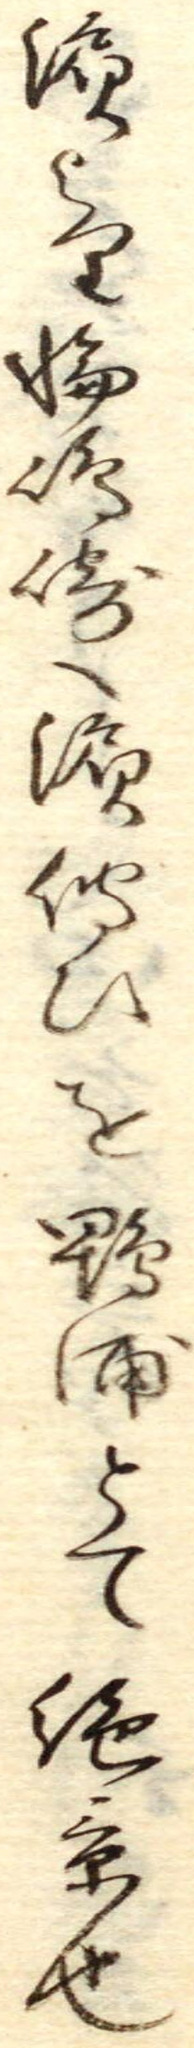浜より輪嶋崎へ浜伝ひを鴨浦とて絶景也
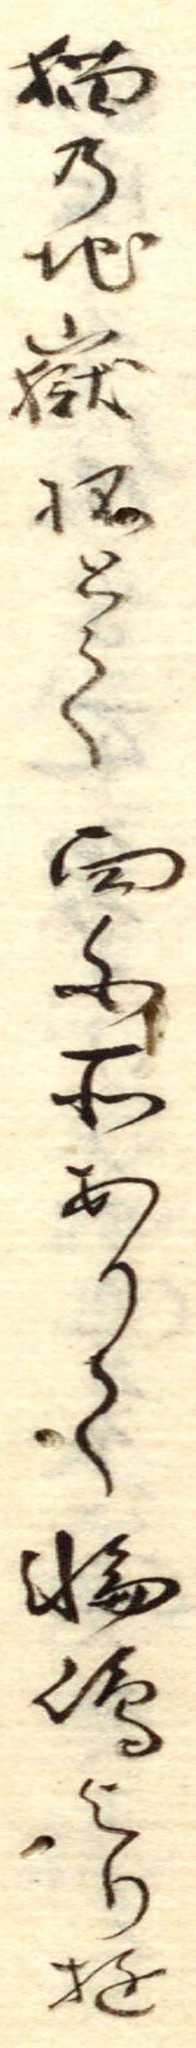猫の地獄抔とて面白所ありて輪嶋より遊
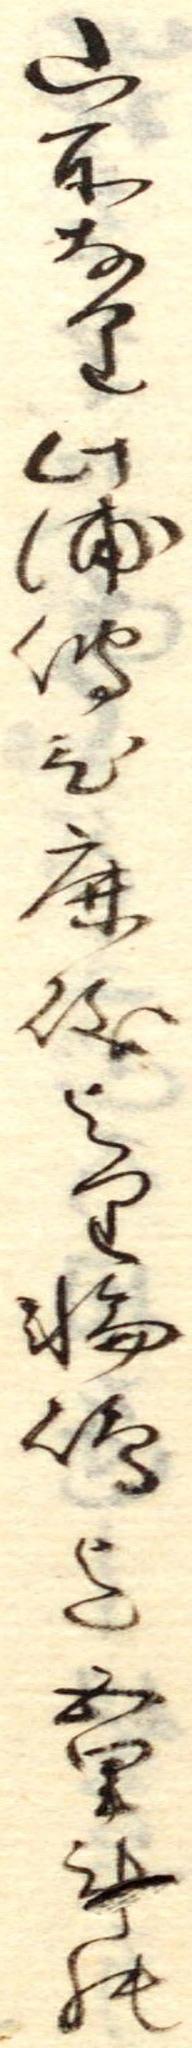山所此浦伝ひ鹿礒より輪嶋迄五里計の
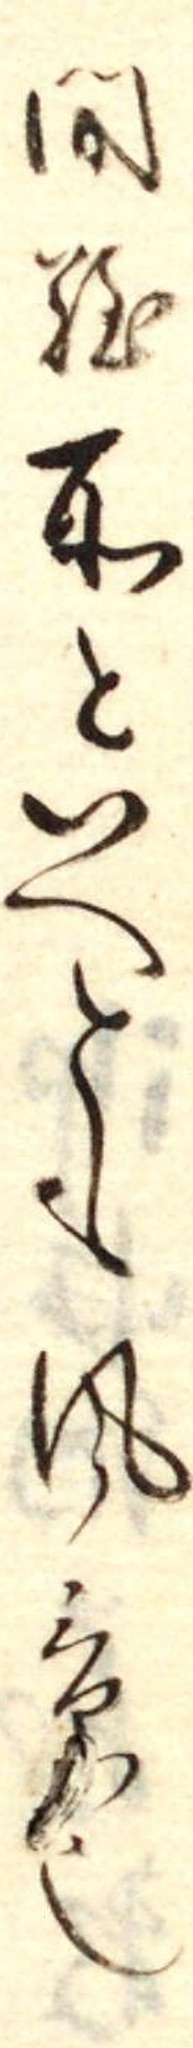間難所といへとも風景也
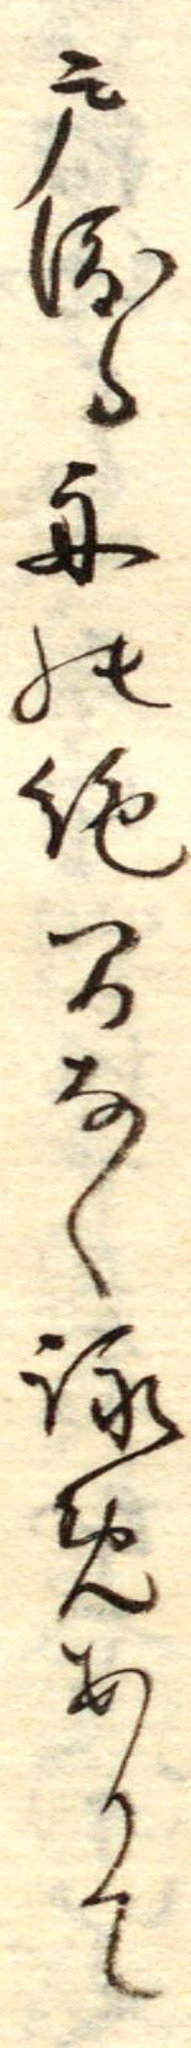戸渡る舟の絶間なく詠めありて
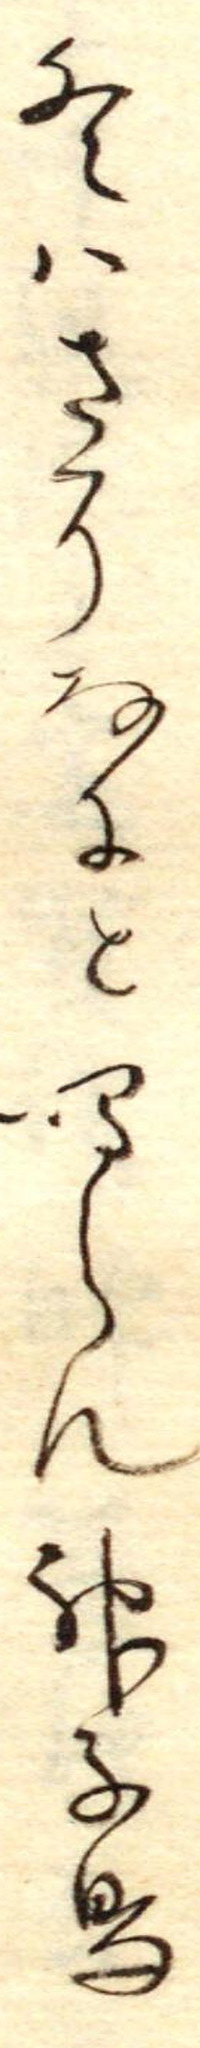冬はさになにと鳴らん神子島

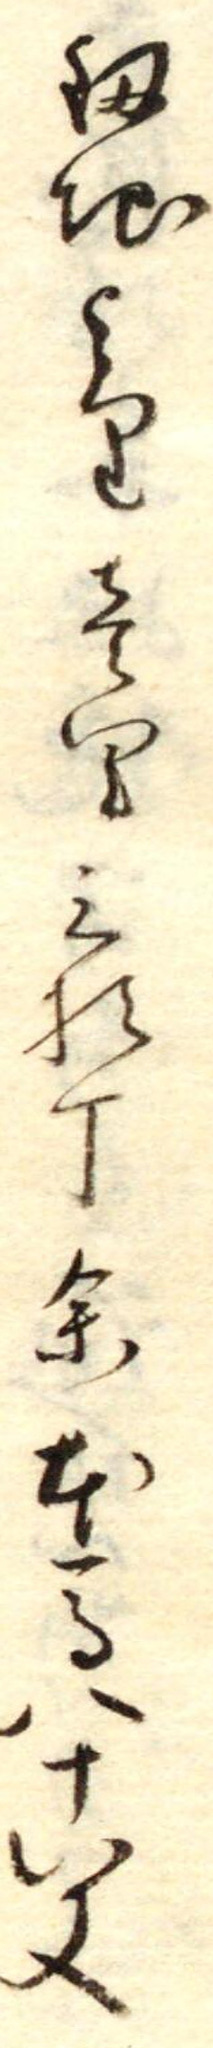釼地より壱里三拾丁余本馬八十八文
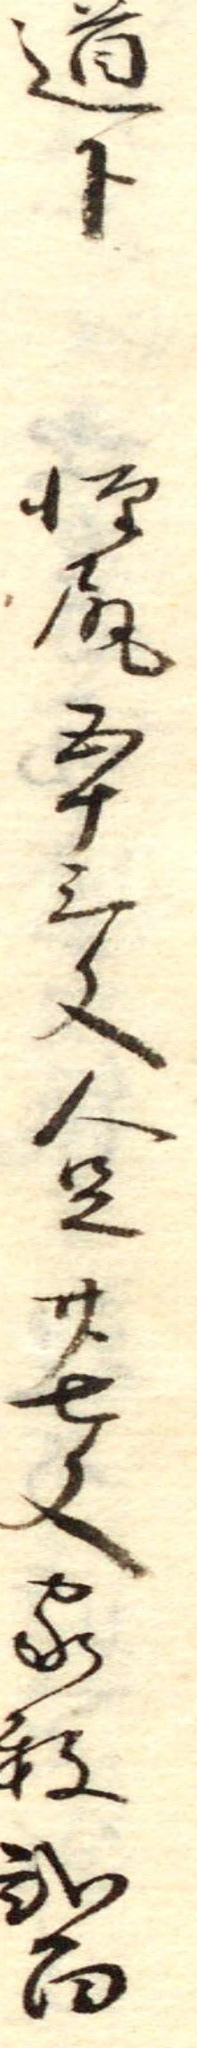道下軽尻五十三文人足廿七文家数弐百
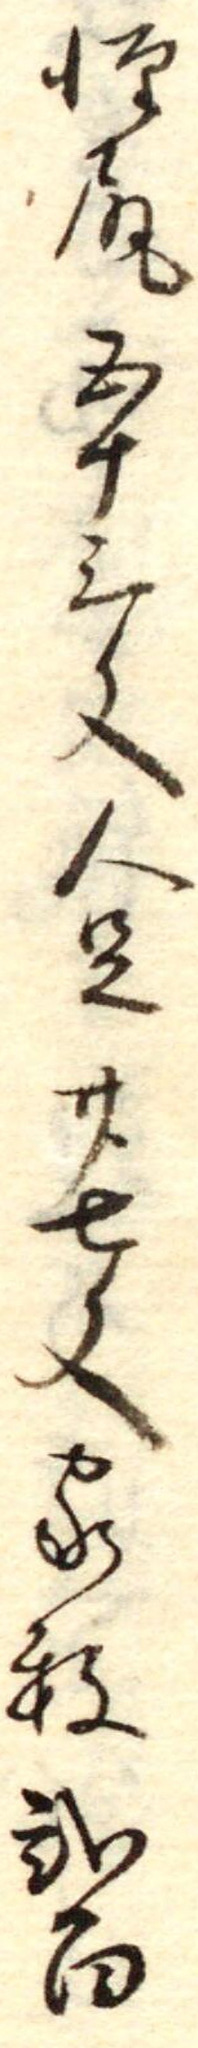道下軽尻五十三文人足廿七文家数弐百
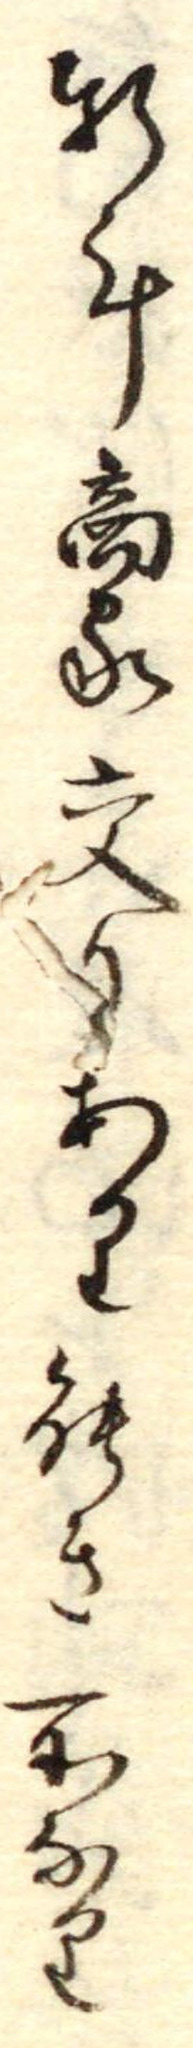軒計商家交りあり能き所なり
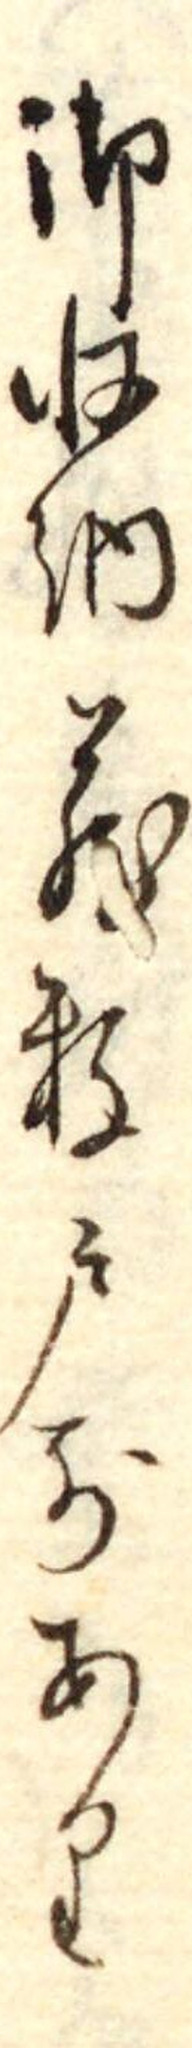御収納蔵数戸別あり
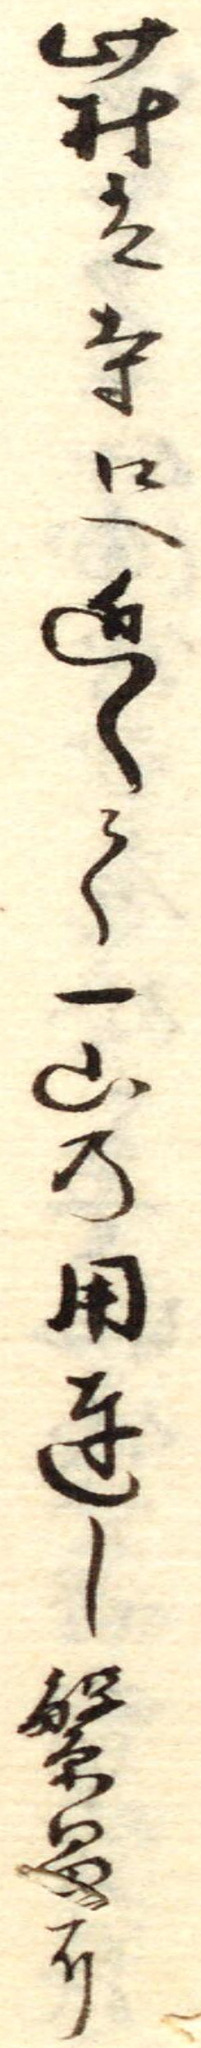此村は寺口へ近くて一山の用達し繁昌に
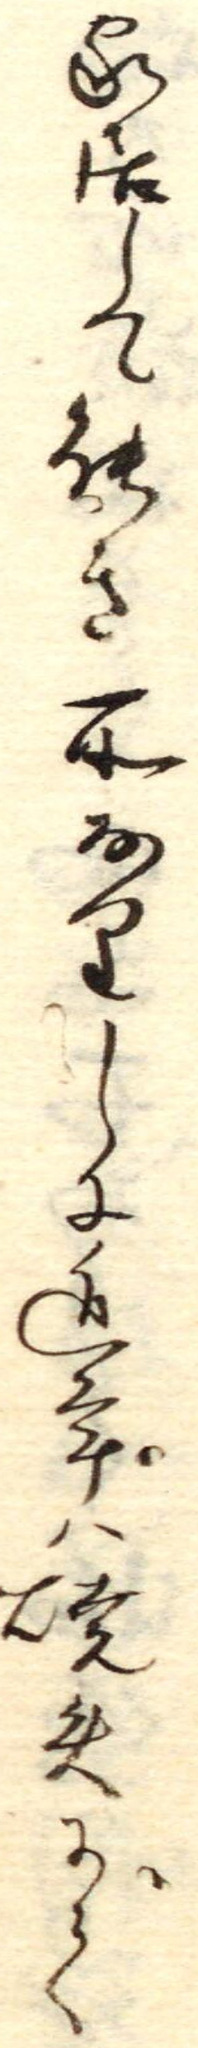家居して能き所なりしに近年は焼失にて
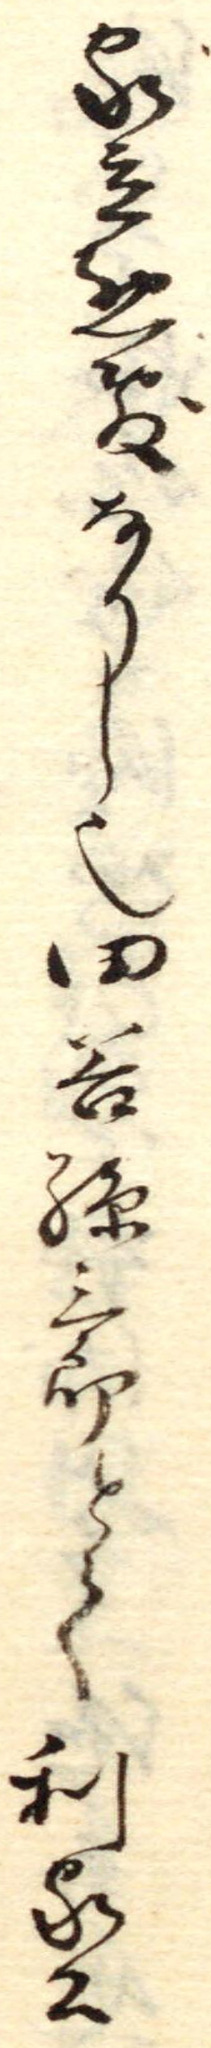家立悪敷なりし也田谷孫三郎とて利家公
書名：能登名跡誌
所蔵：Ishikawa Prefectural Library
